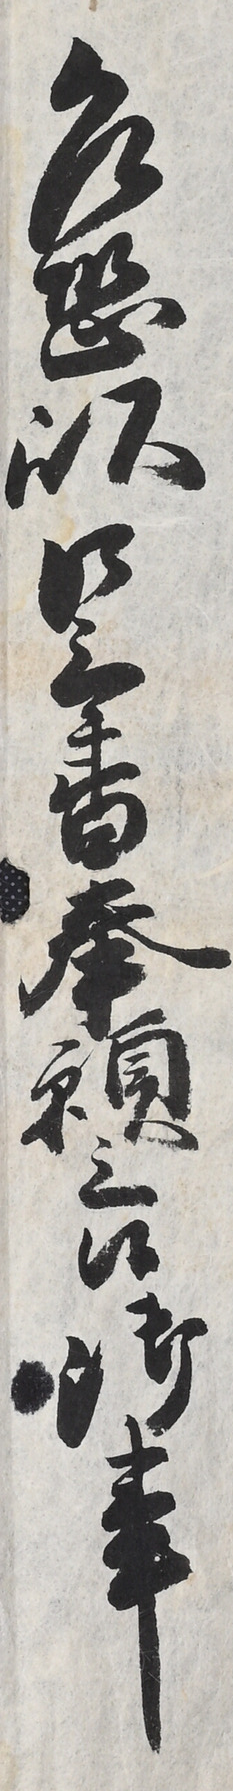乍恐以口上書奉願上候御事
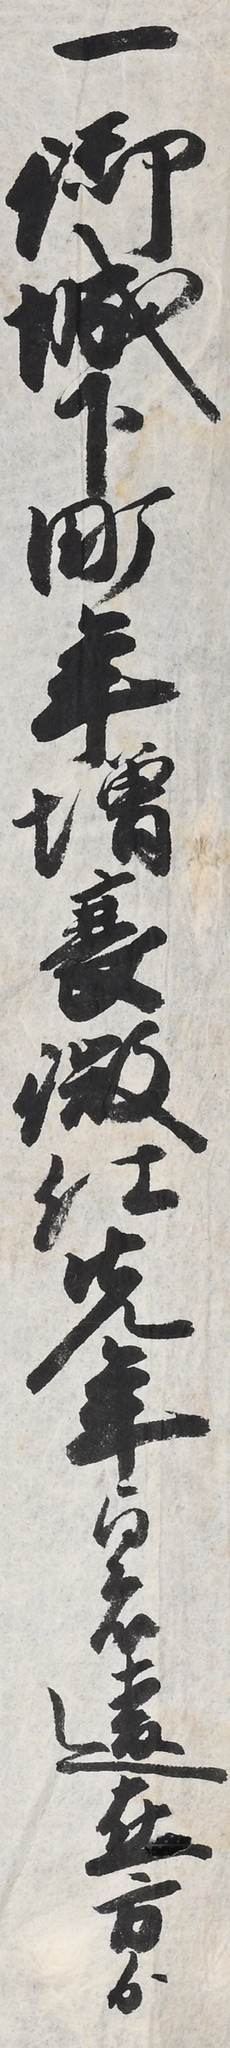一御城下町年増衰微仕先年とは違在方ゟ
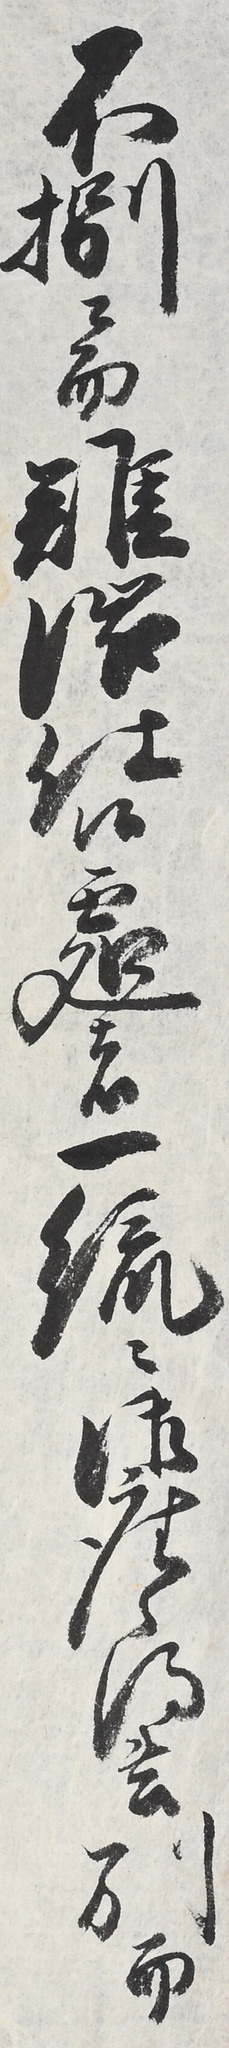不捌ニ而難渋仕候処は一統ニ御座候得共別而
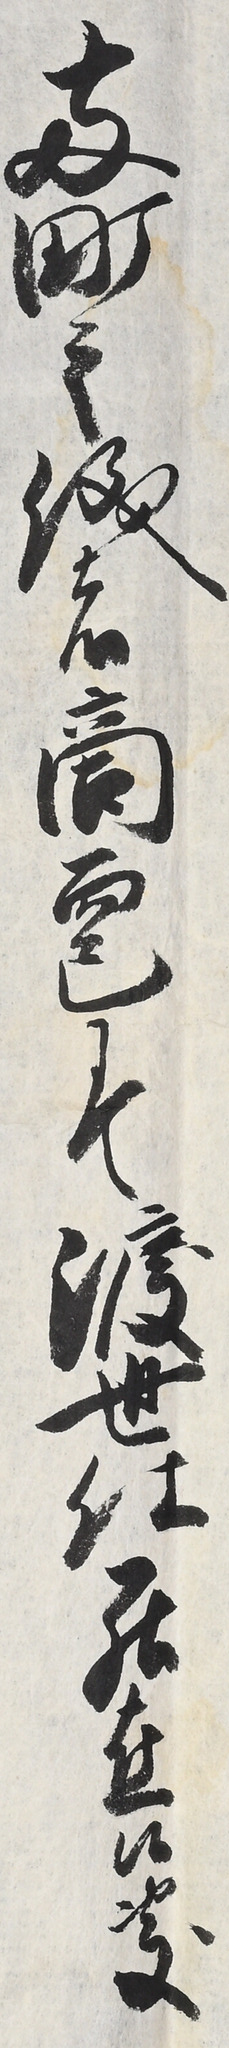両町之儀は商而已にて渡世仕罷在候処
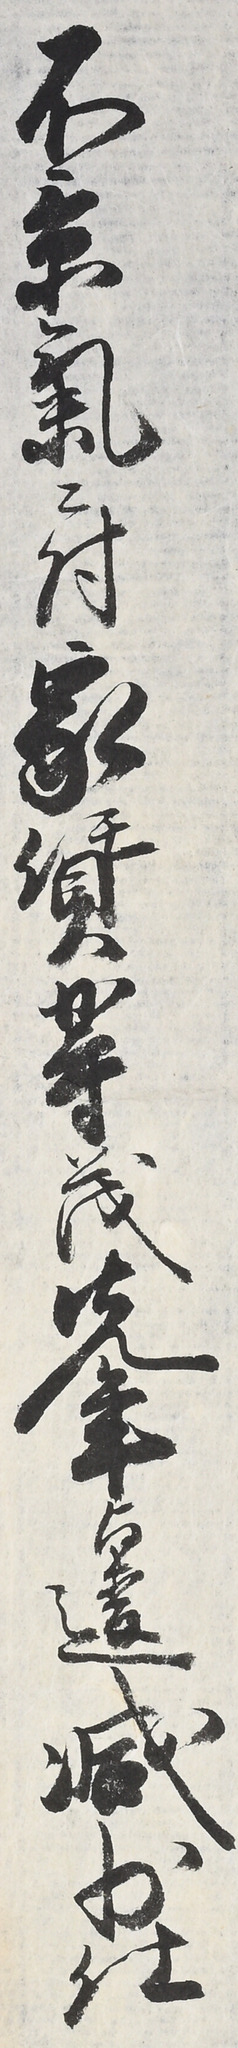不景気ニ付家賃等も先年と違減少仕
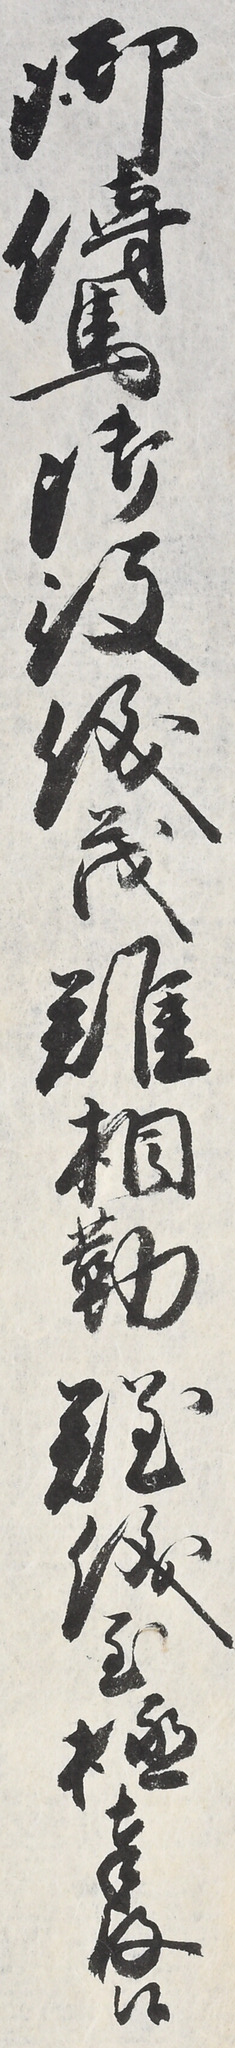御伝馬御改儀も難相勤難儀至極奉存候
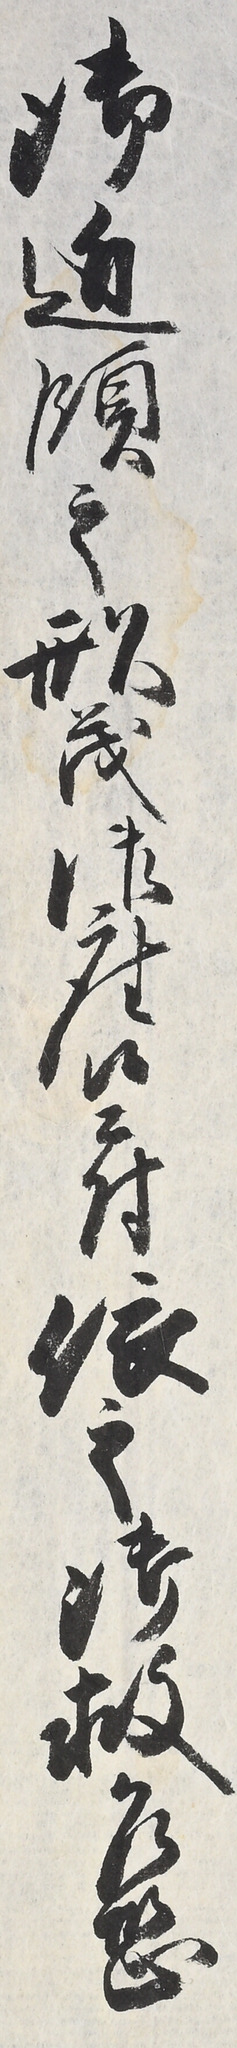御近頃之形も御座候ニ付依之御救乍恐
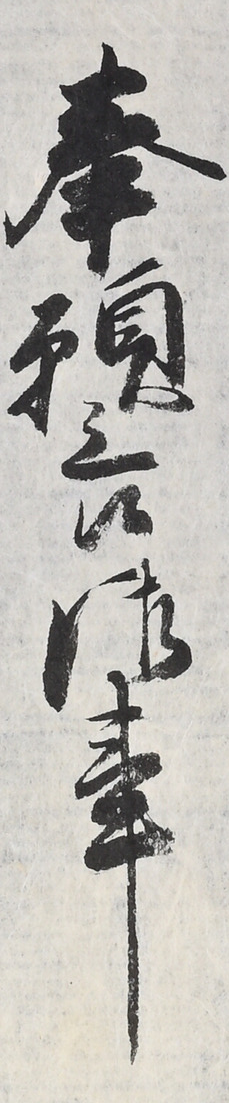奉願上候御事
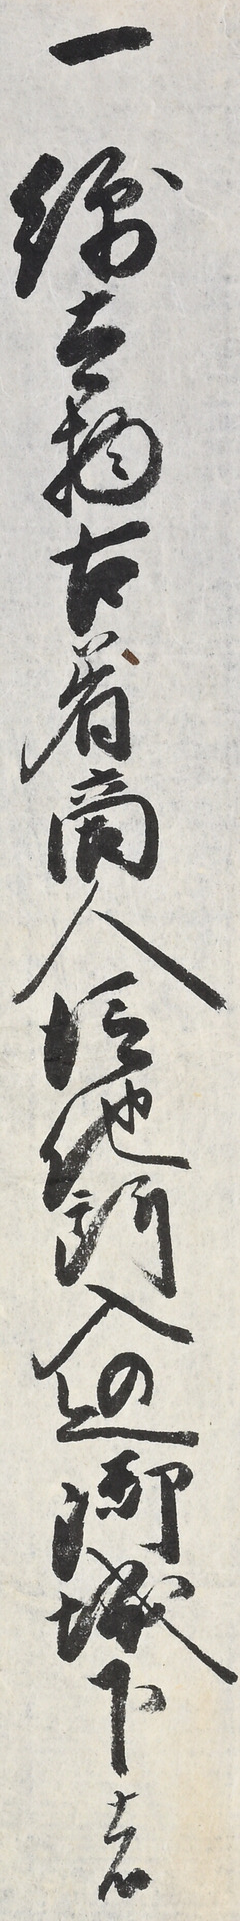一綿太物古着商人従他所入込御城下は
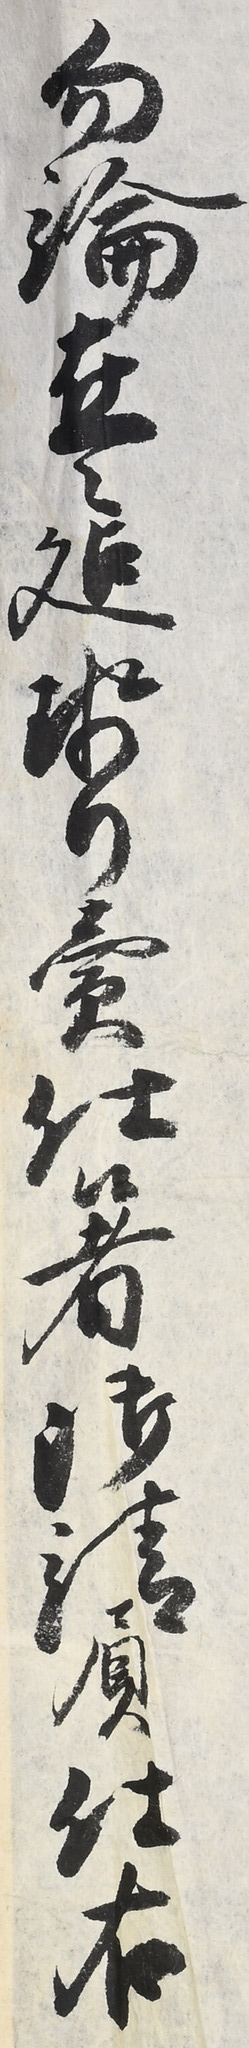勿論在々迄せり売仕候者御請負仕右
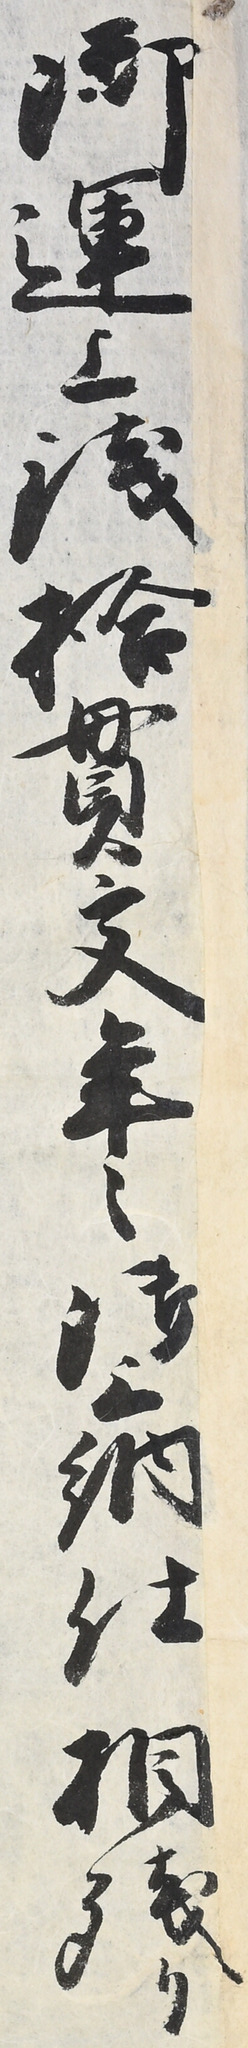御運上銭拾貫文年々御上納仕相残り
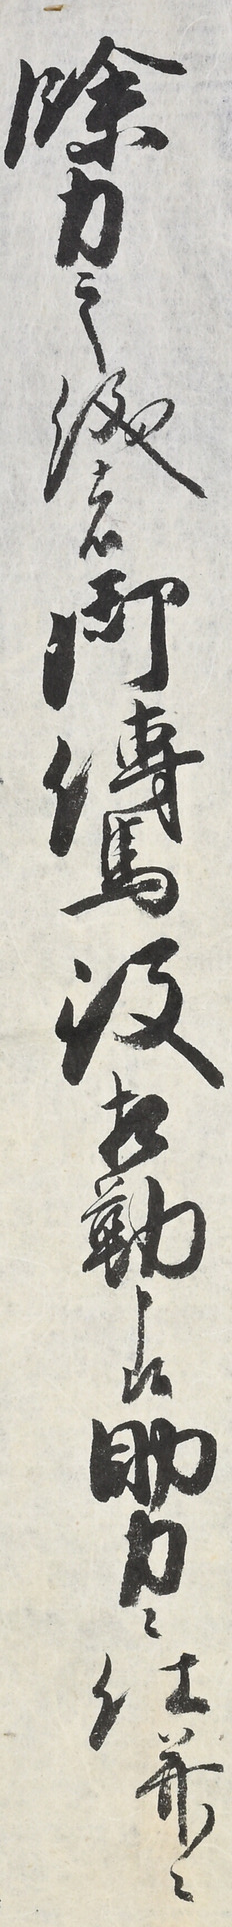余力之儀は御伝馬役相勤申候助力ニ仕并ニ
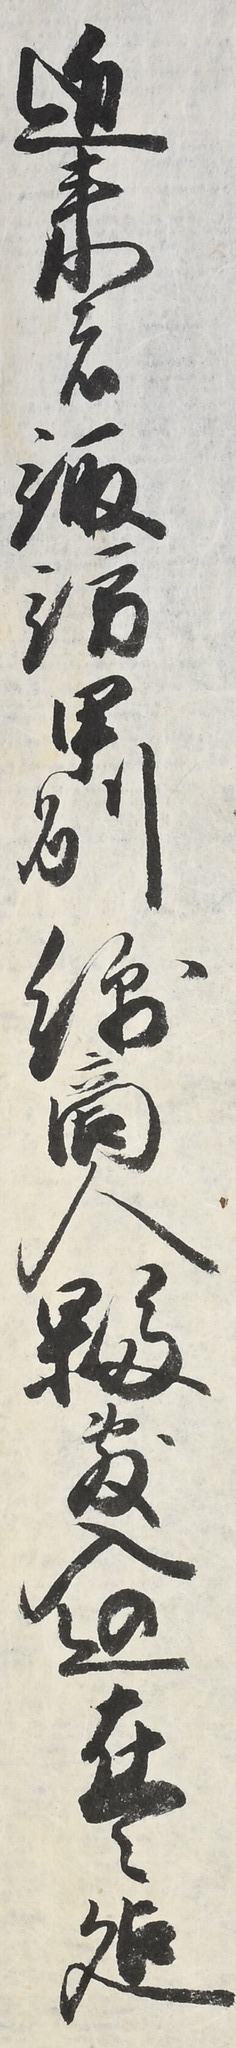近来は諏訪甲州綿商人夥敷入込在々迄
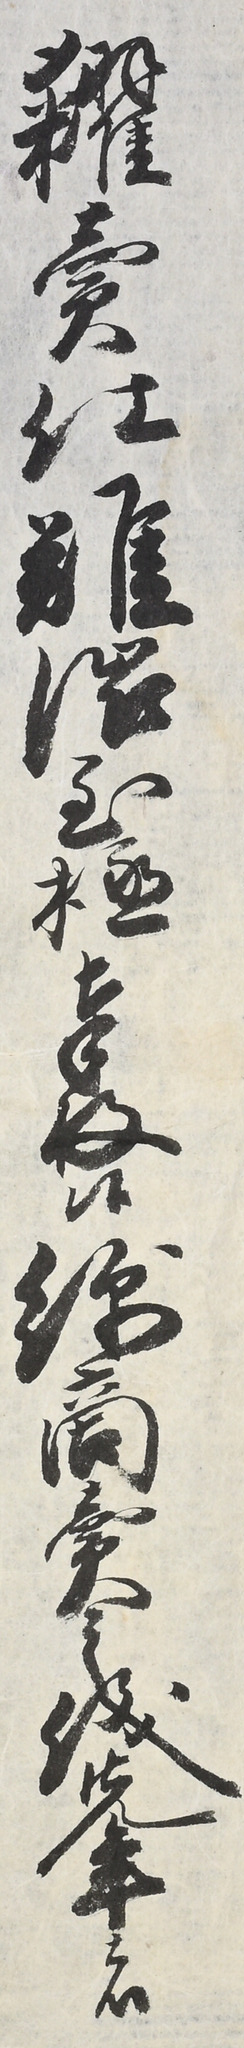糶売仕難渋至極奉存候綿商売之儀先年は
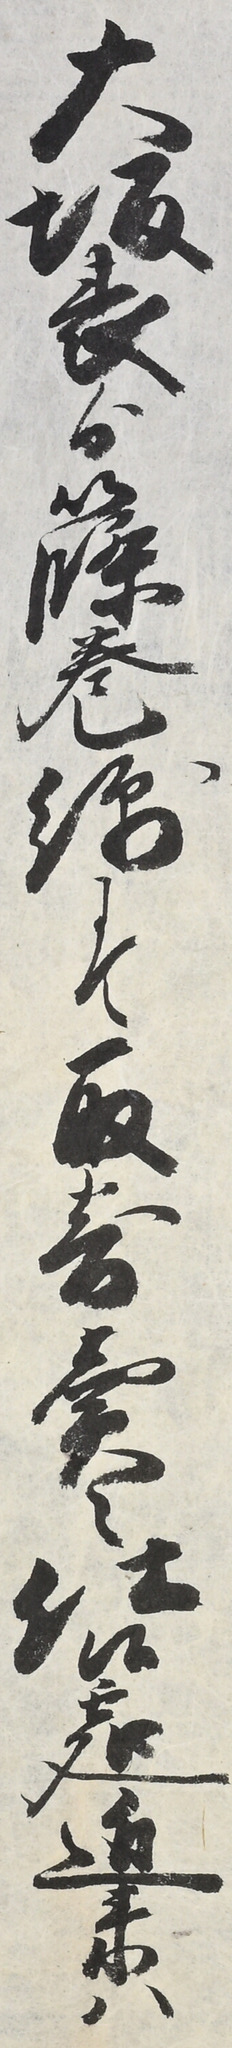大坂表ゟ篠巻綿にて取寄売ニ仕候処近来ハ
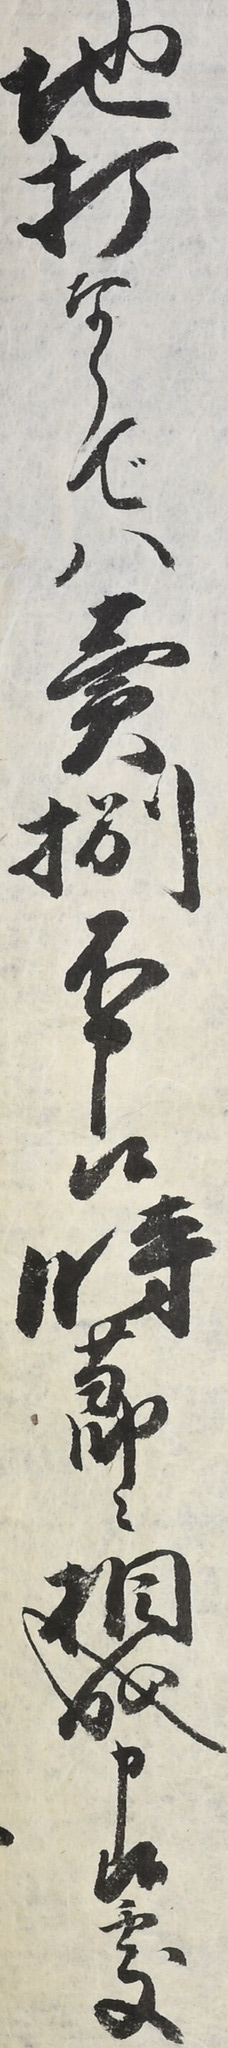他行ならでハ売捌不申候時節ニ相成申候処
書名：乍恐以口上書奉願上候御事
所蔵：伊那市立高遠町図書館・合同会社AMANE
